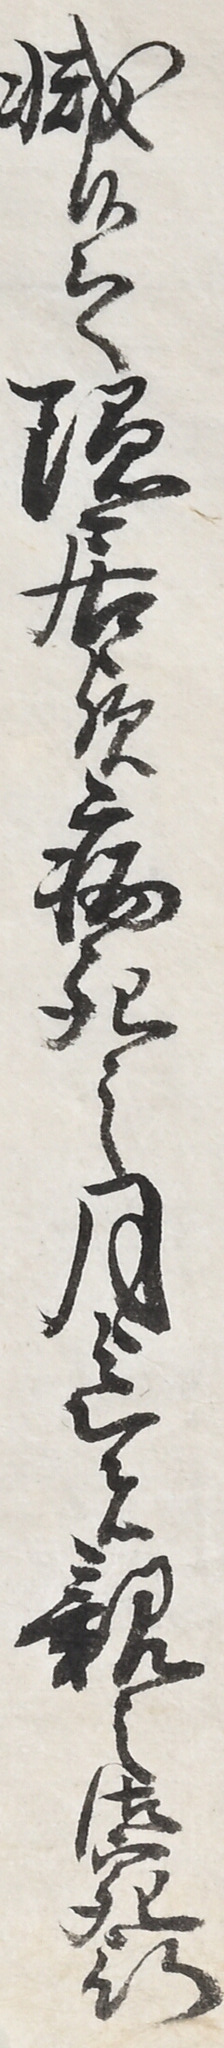減候ハヽ隠居欤病死之月迄は親之御宛行
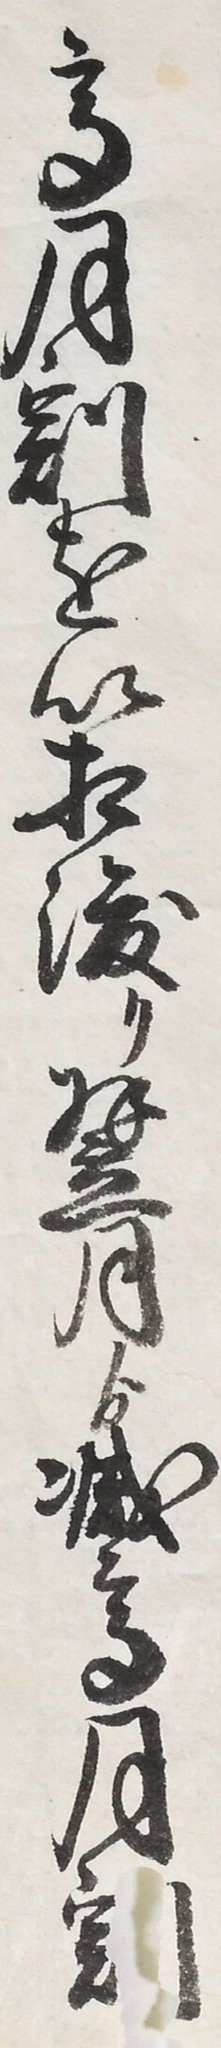高月割を以相渡り翌月ゟ減高月割
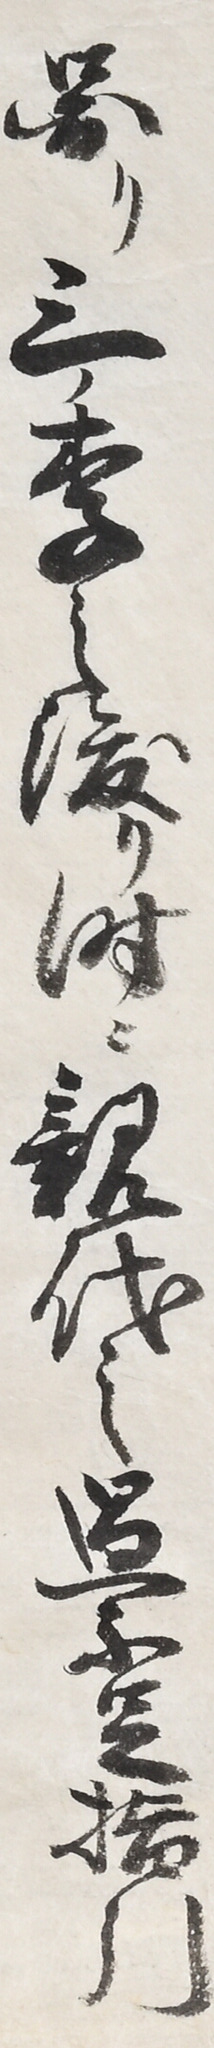図り三季之渡り時ニ親代之過不足指引
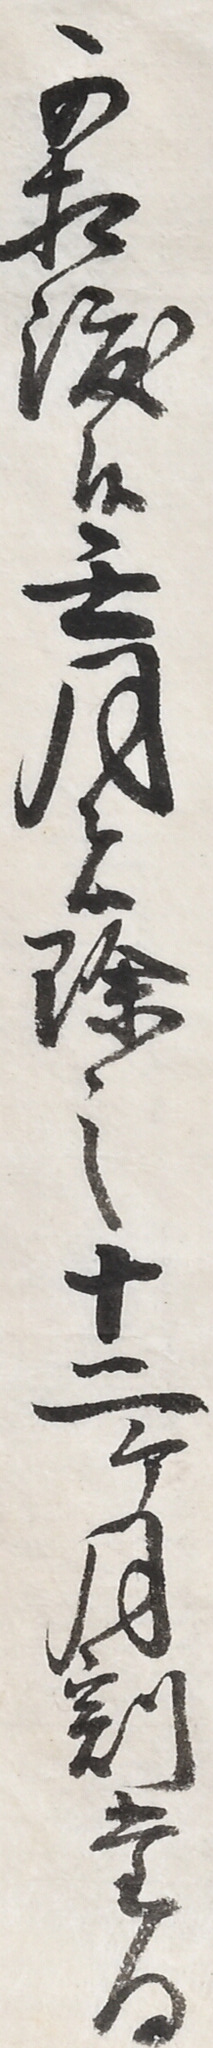可相渡候閏月は除之十二月ヶ月割たる
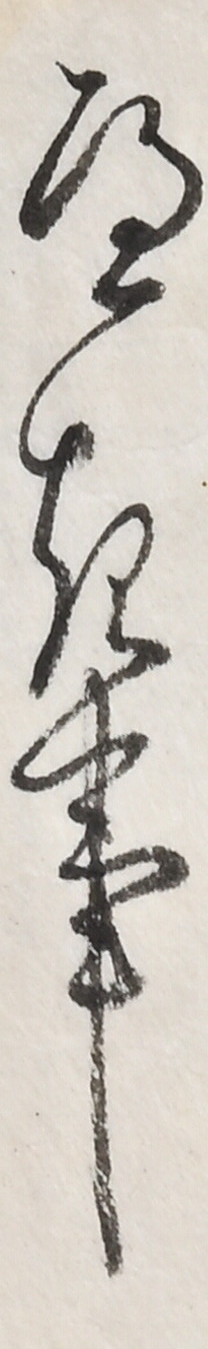へき事
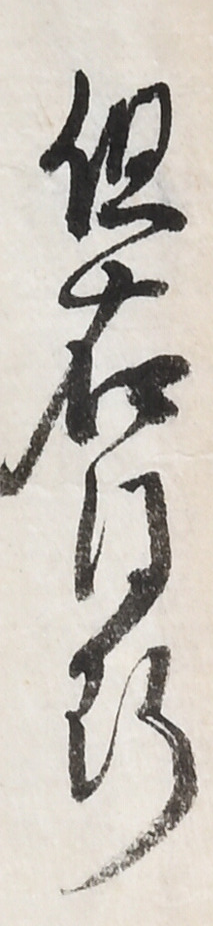但右同断
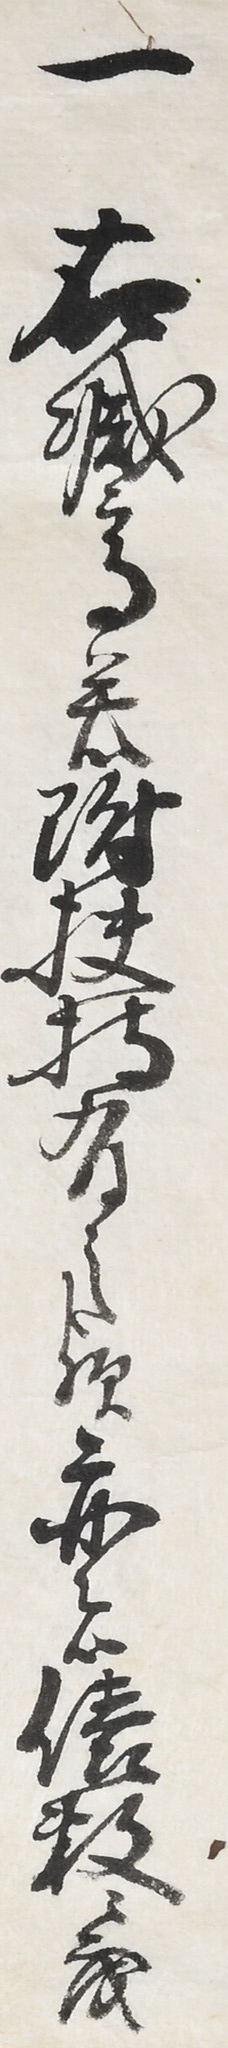一右減高は附扶持有之欤亦は俵数ニも
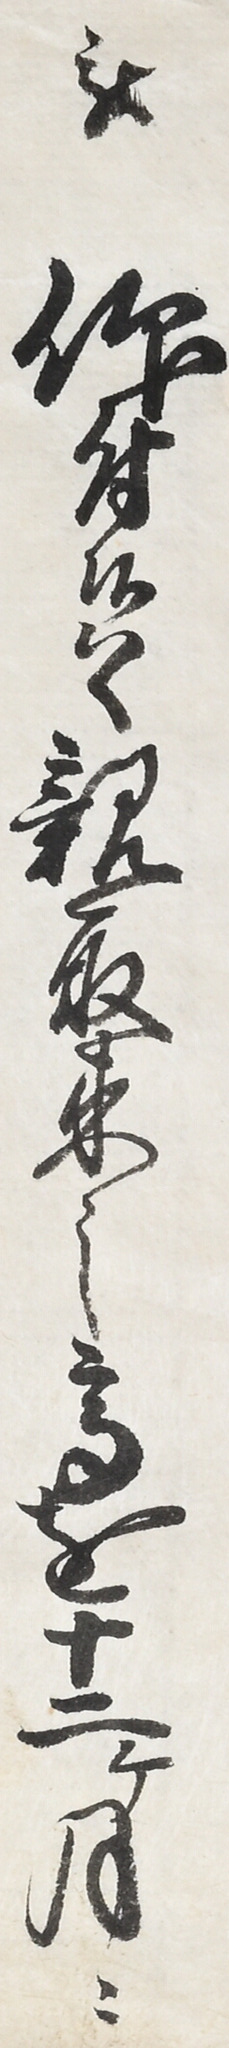被仰付候ハヽ親取来之高を十二ヶ月ニ
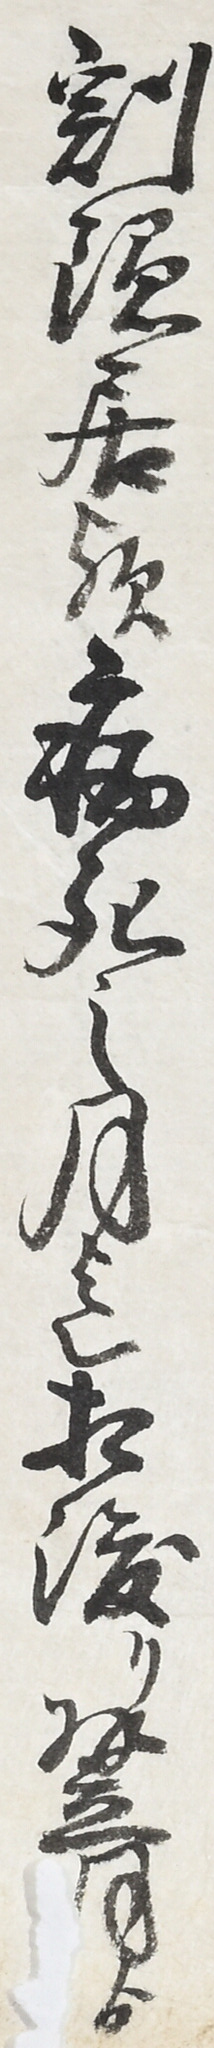割隠居欤病死之月迄相渡り翌月ゟ
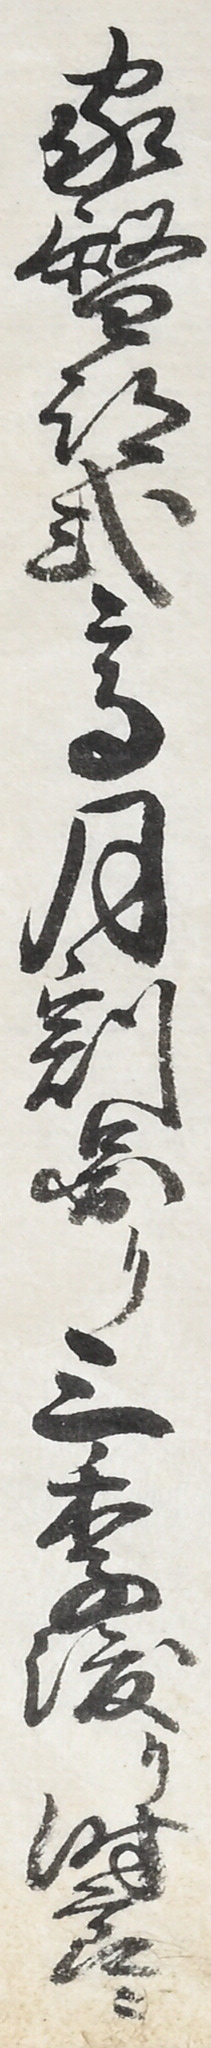家督跡式高月割図り三季渡り時節ニ
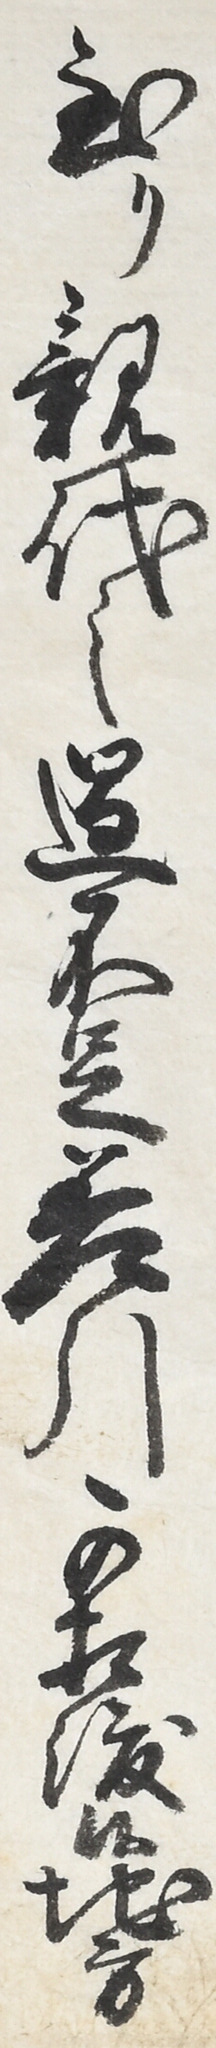至り親代之過不足差引可相渡候地方
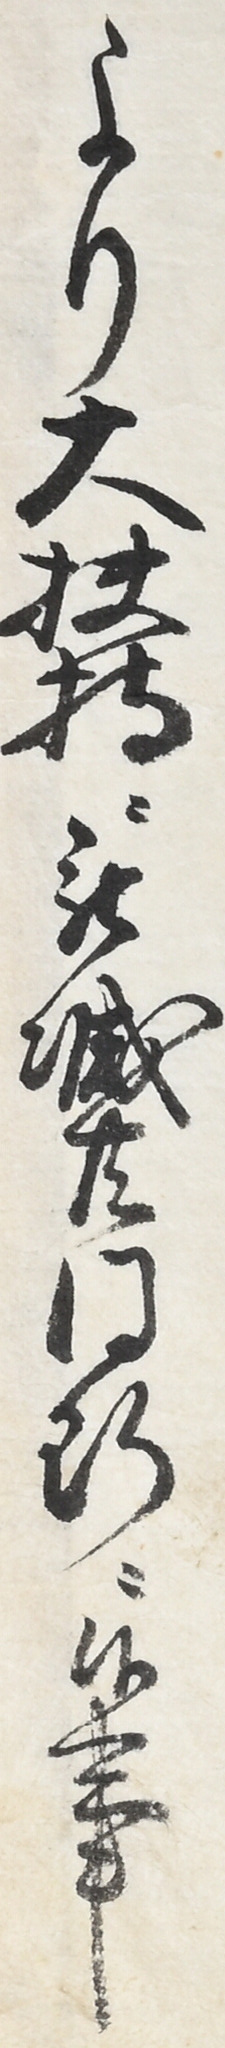より大扶持ニ被減共同断ニ候事

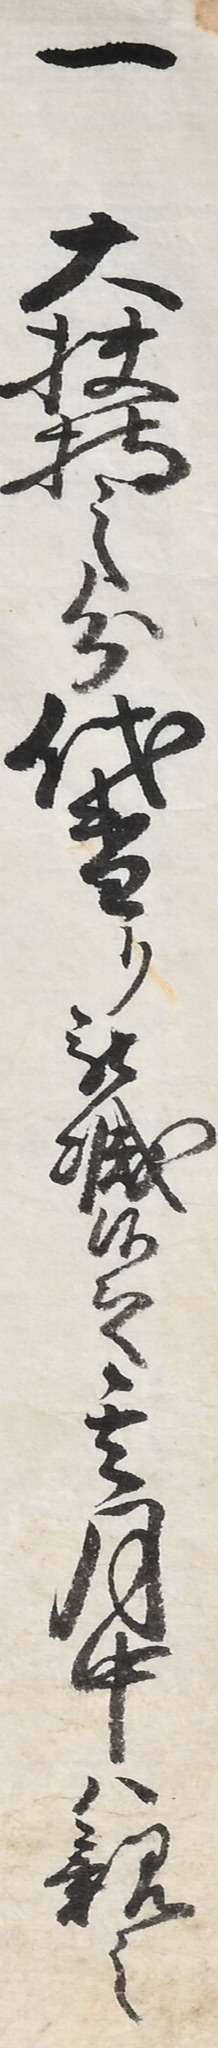一大扶持之分代替被減候ハヽ其月中ハ親之
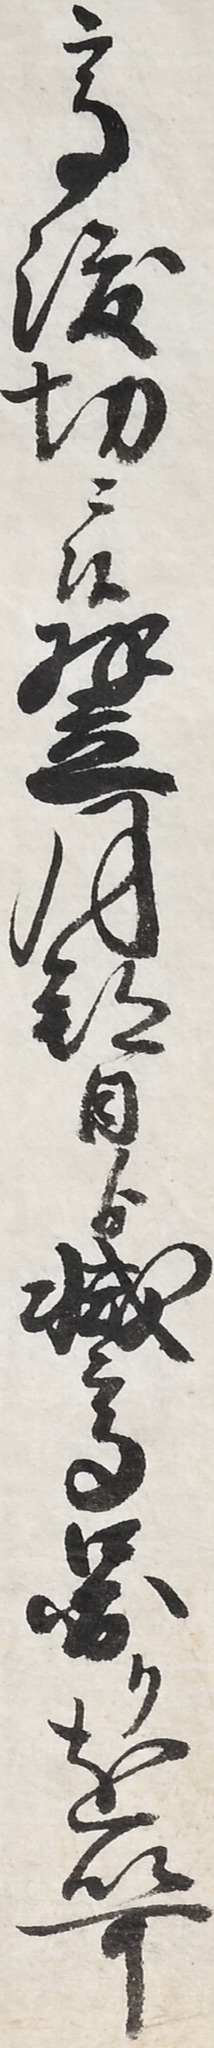高渡切ニ候翌月朔日ゟ減高図りを以可
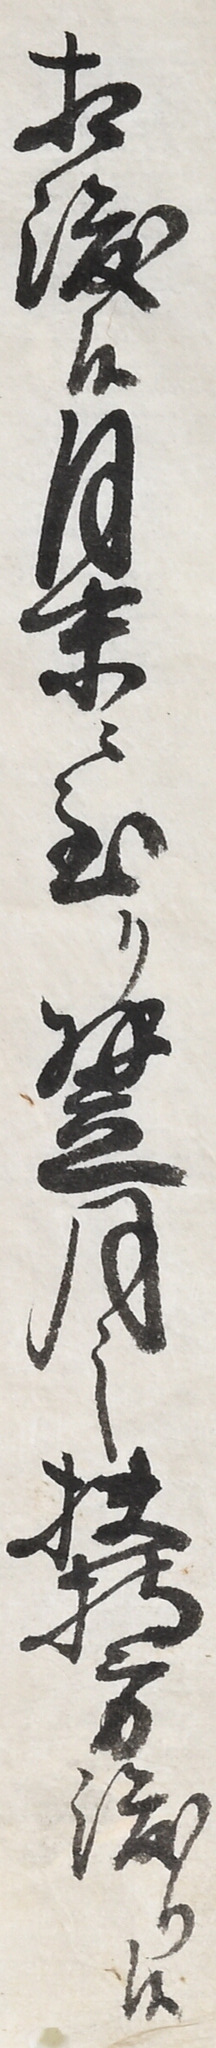相渡候月末ニ至り翌月之扶持方渡り候
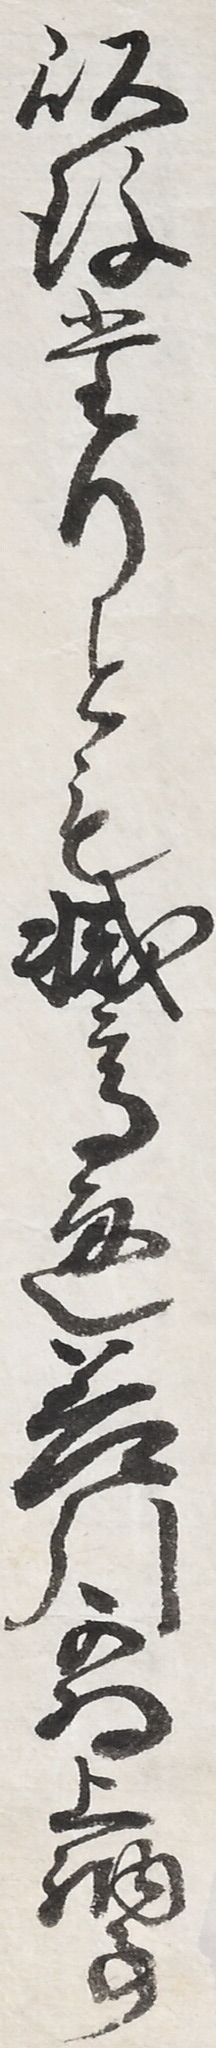以後たりとも減高通差引可為上納事
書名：御給分渡方之定
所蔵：伊那市立高遠町図書館・合同会社AMANE
